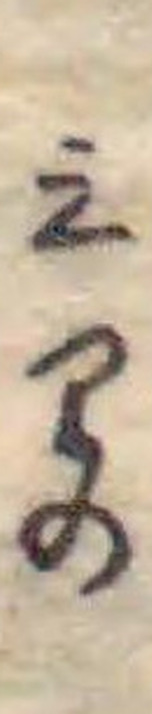三りの
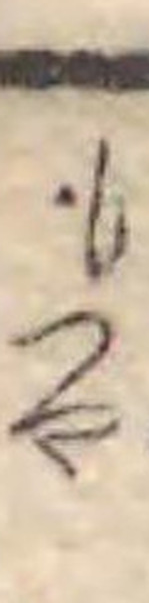もつや
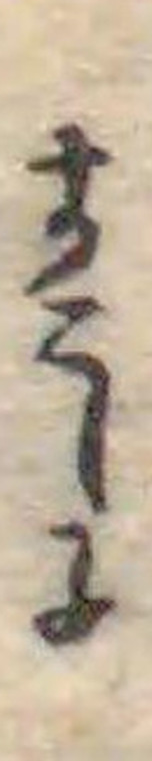すこしに
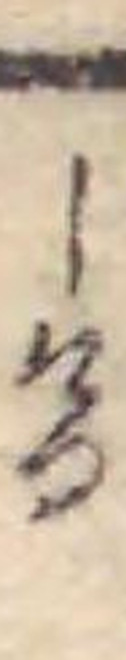しける
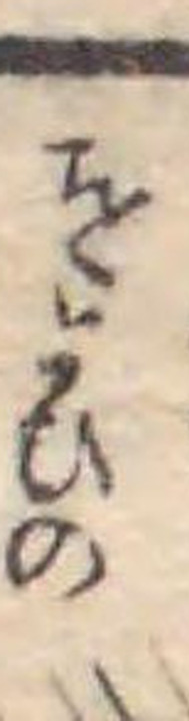をよひの
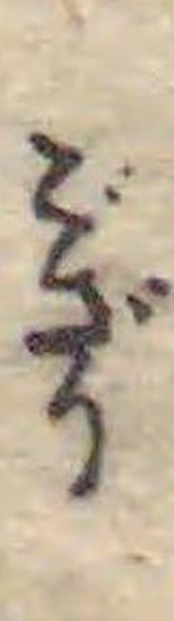ござり
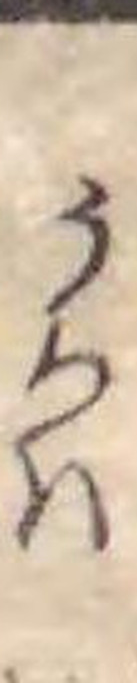うちは
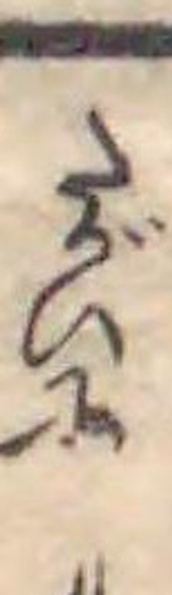たがいに
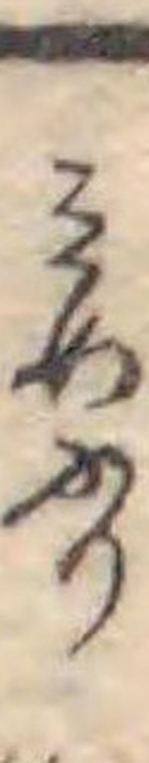みめふり
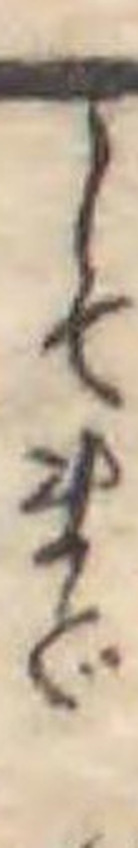してまど
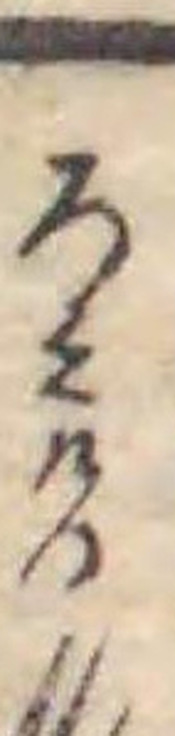ろみける

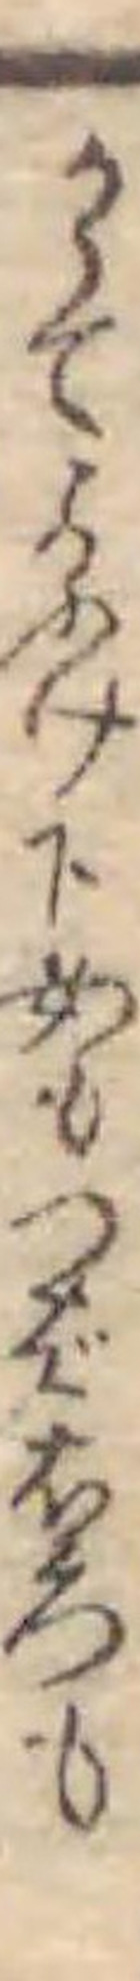かくてよふけ下女もつば右衛門も
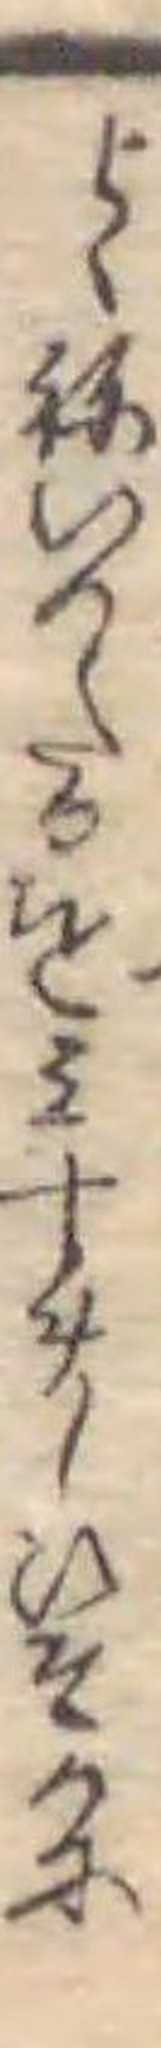よくねいつたるをみすましひそかに
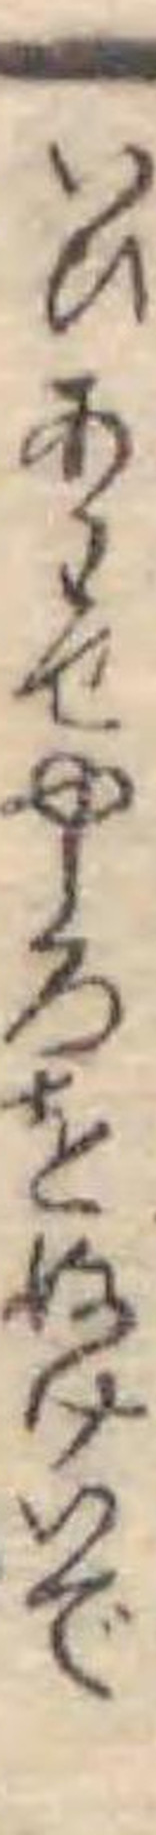いひあわせやしろをぬけいで
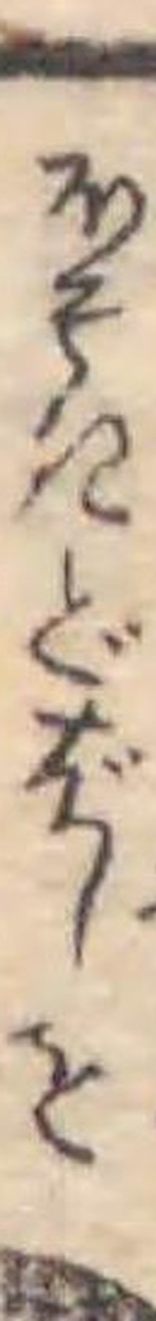ほそきどばしを
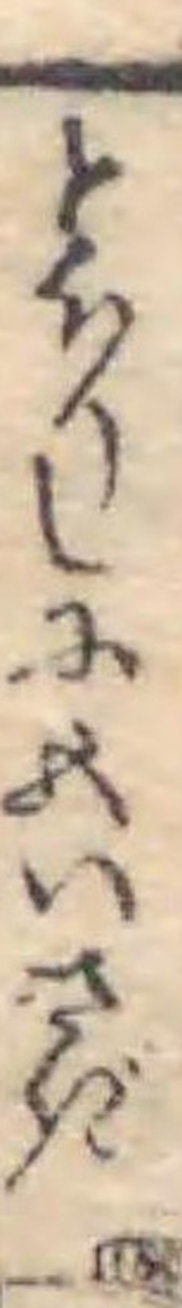とほりしに五いさぎ
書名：鐘入七人化粧 : 3巻
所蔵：国立国会図書館 National Diet Library, JAPAN
